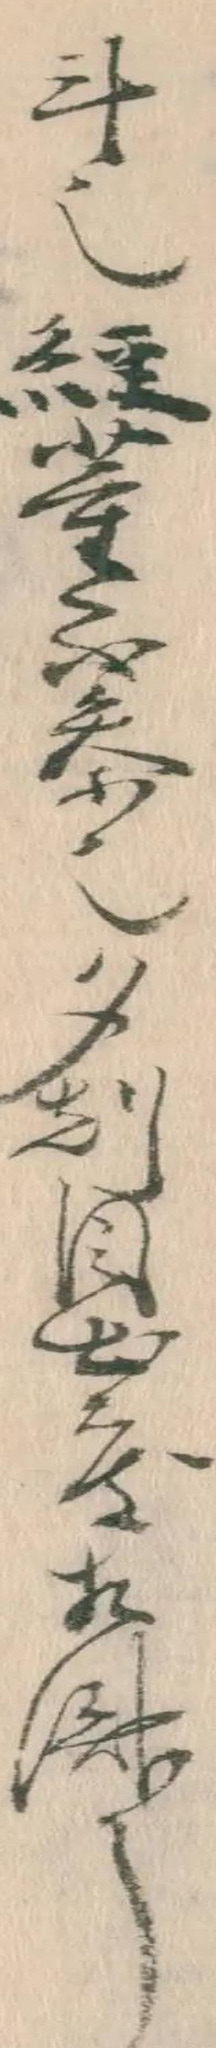斗也経董不参也夕刻目出度相済了
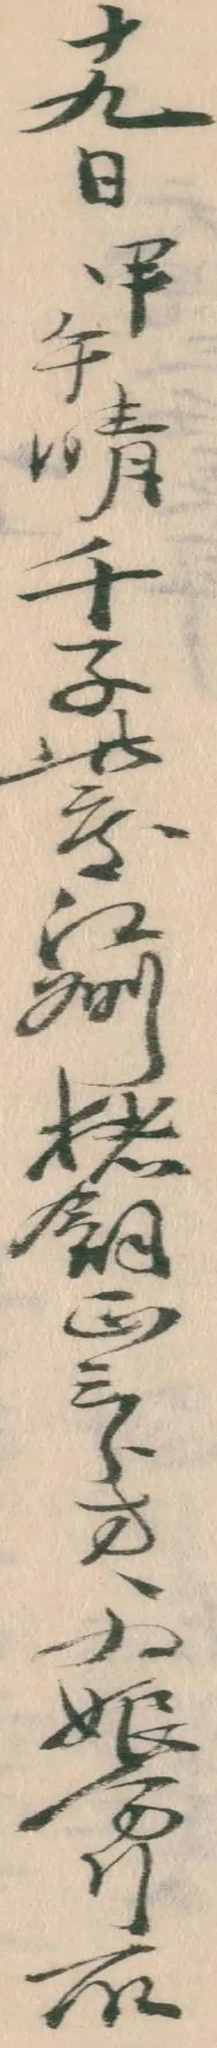十九日甲午晴千子此度江州猪飼正三郎方へ為娘合引取
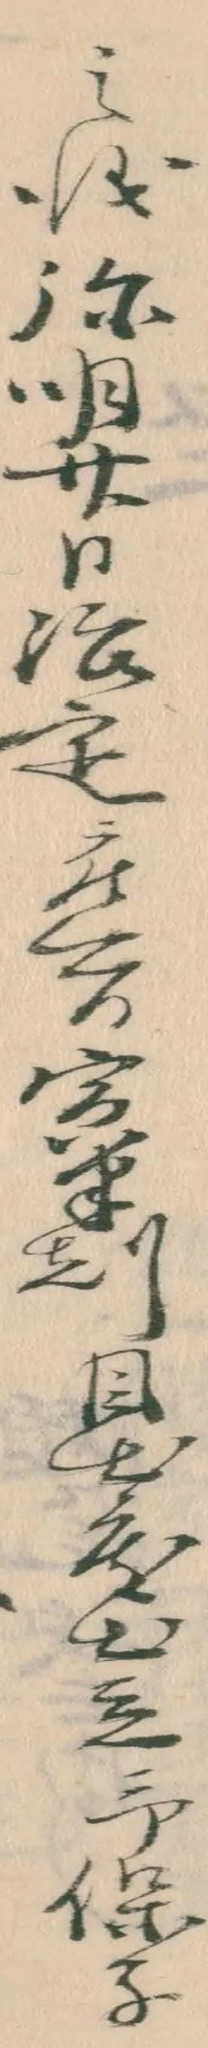之儀弥明廿日治定ニ付今日寅半刻目出度出立予保子
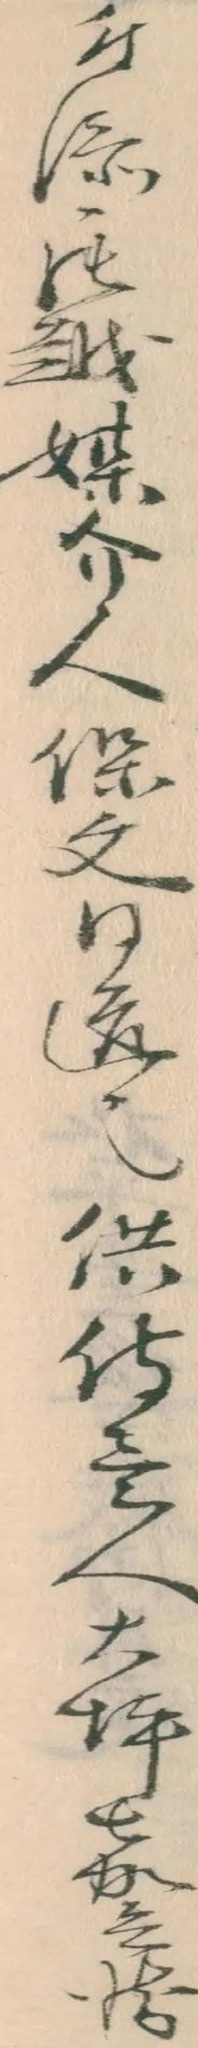付添罷越媒介人保文同道也供侍壱人大坪嘉兵衛
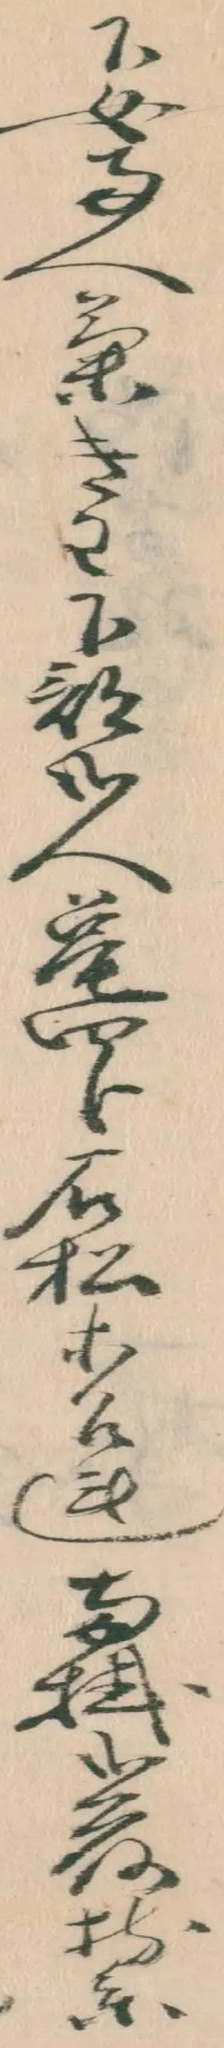下女両人菊きわ下部弐人亀四郎石松等召連両掛弐荷持参
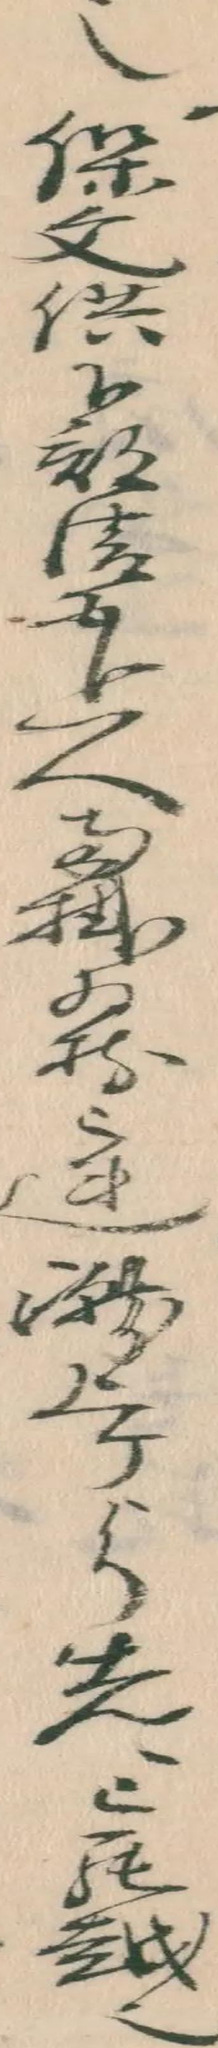也保文供下部清五郎一人両掛為持被連俄上ケより先へ被罷越也
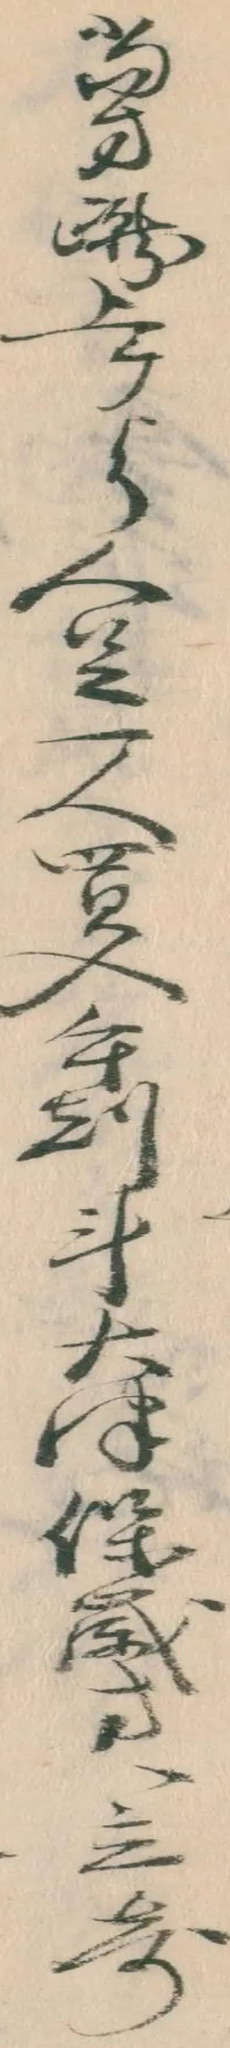當方蹴上ケより人足一人買入午刻斗大津保歳方へ立寄
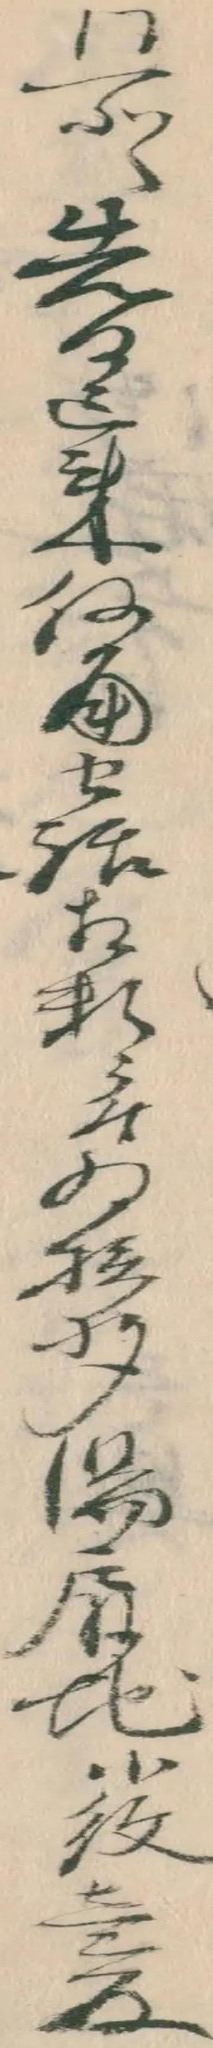同所へ先日已来何角世話相頼ニ付為挨拶湯肩地小紋壱反
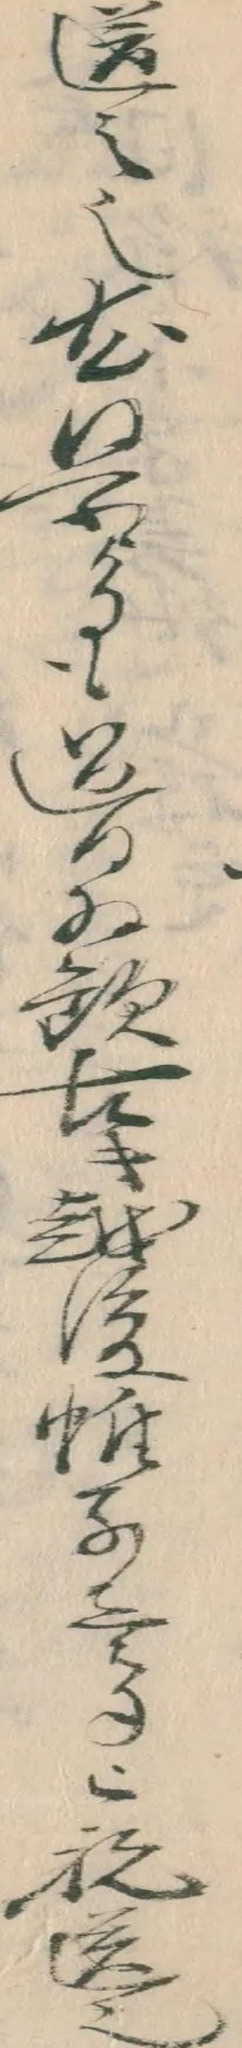送之也尤同所よりも過日為歓古キ越後帷子壱ツ被祝送也
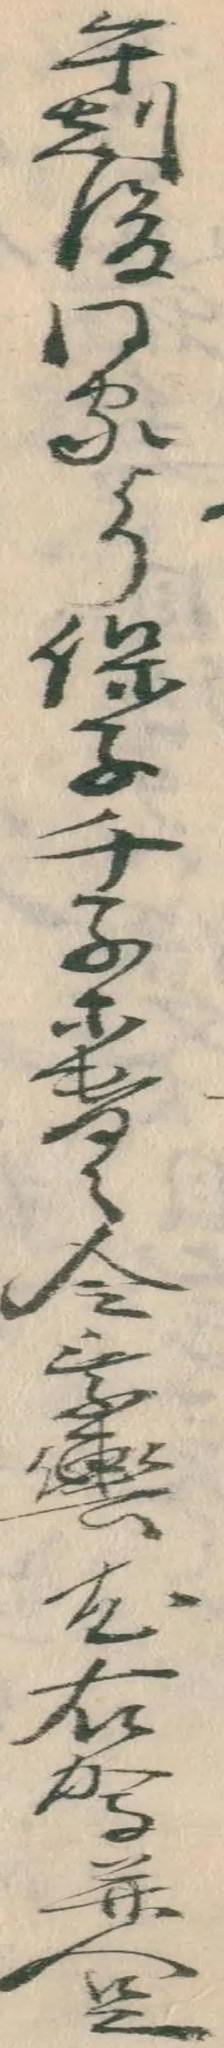午刻後同家より保子千子等者之令乗輿尤右駕并人足
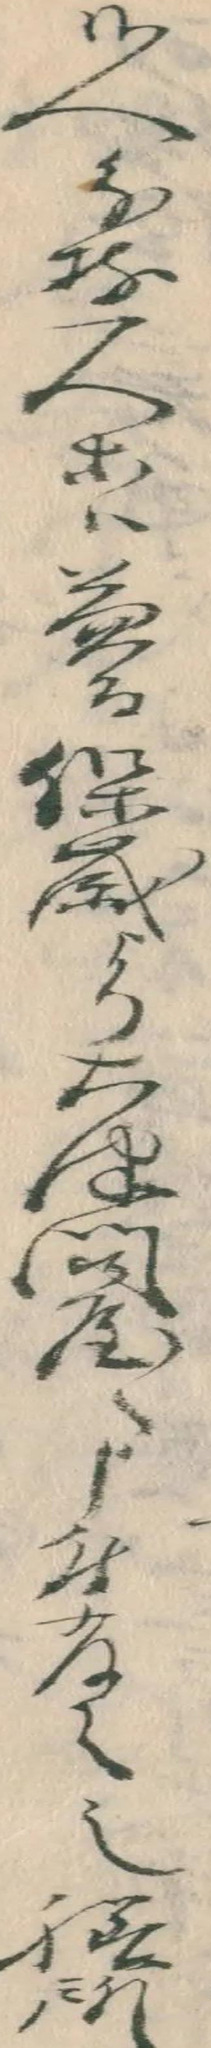弐人分持一人等ハ兼而保歳より大津問屋へ申付有之也膳所
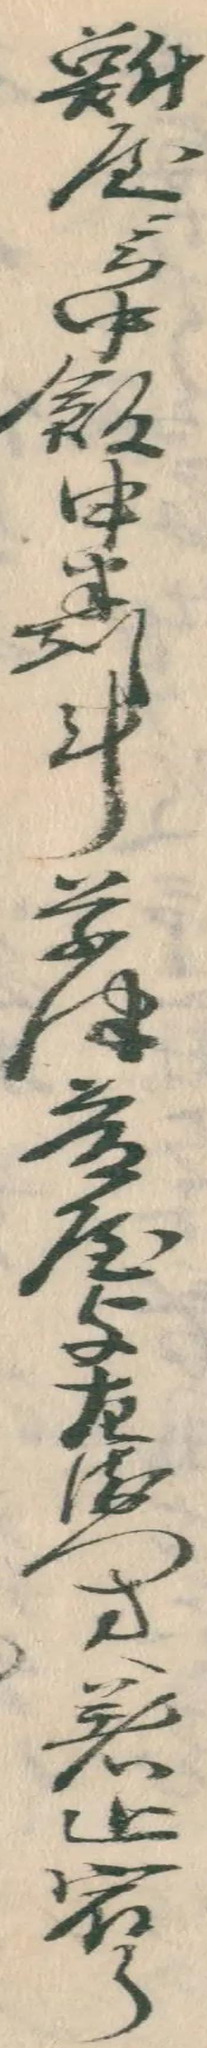鮒屋ニ而中飯申半刻斗草津藤屋与左衛門方へ着止宿了
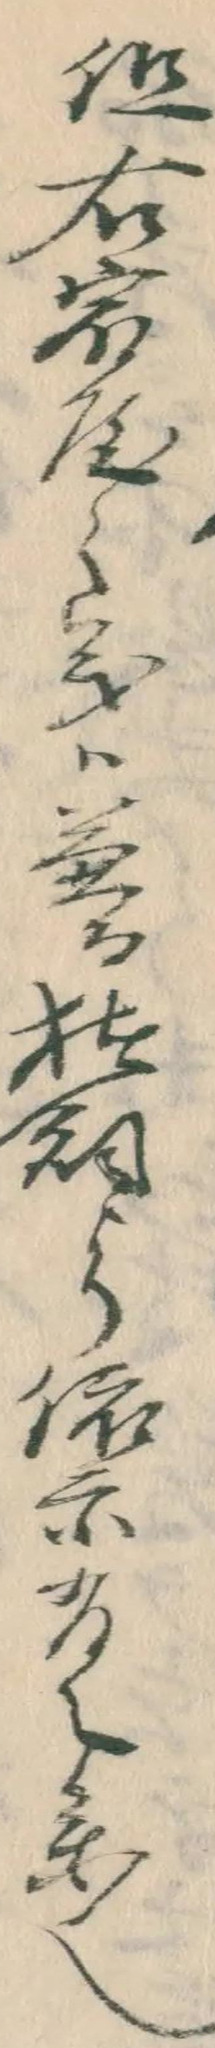但右宿屋之義ハ兼而猪飼より依示有之参也
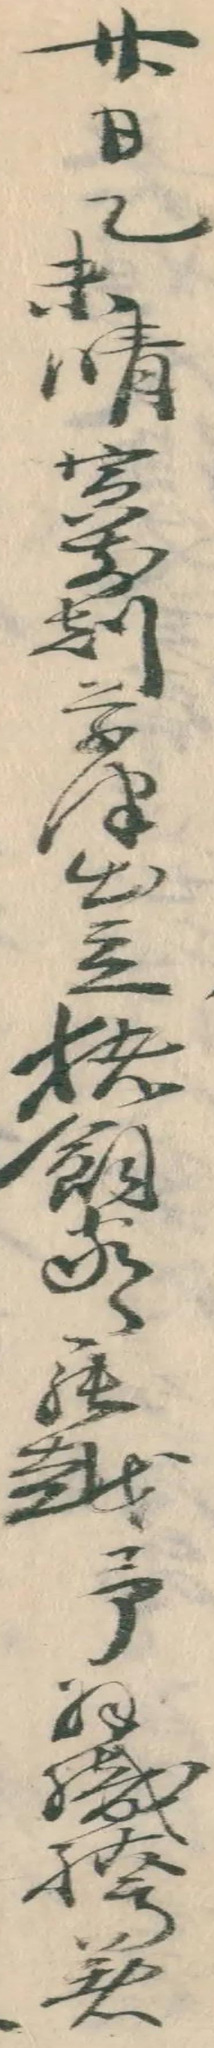廿日乙未晴寅前刻草津出立猪飼処へ罷越予羽織袴着
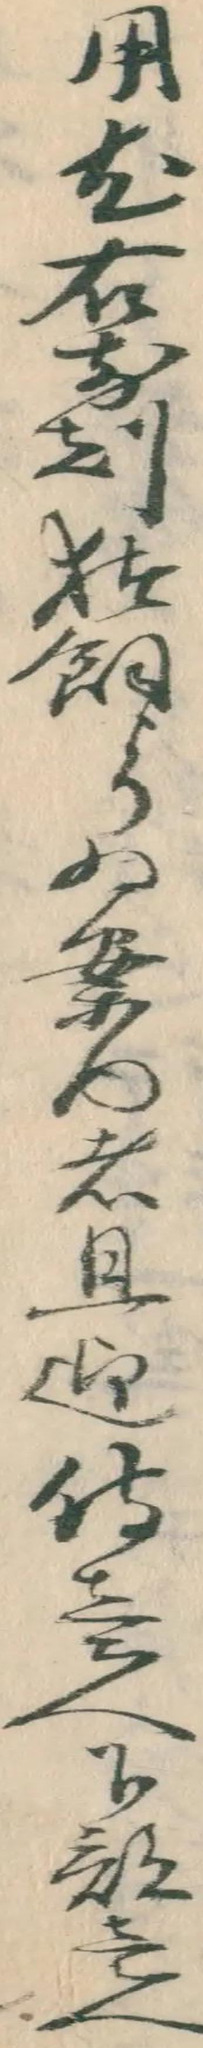用尤右前刻猪飼より為案内者且迎侍壱人下部壱人
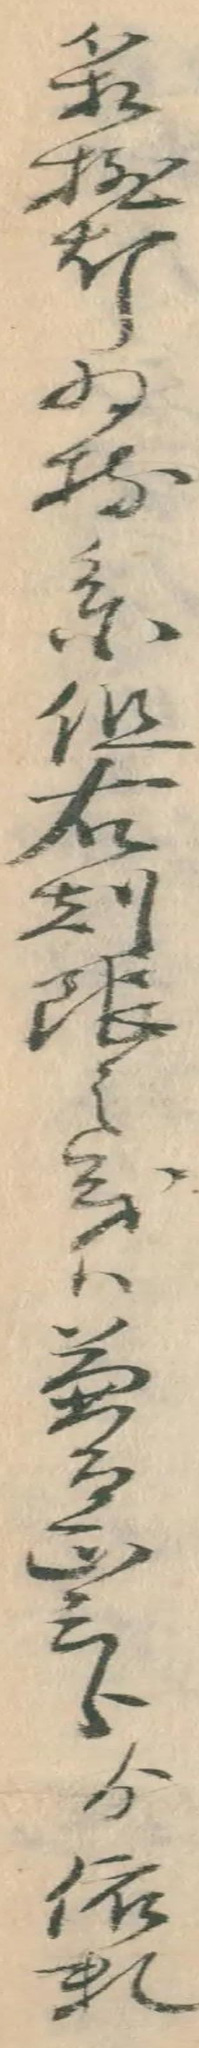箱拾軒為持参但右刻限之義ハ兼而正三郎ゟ依頼
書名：賀茂社記録. 第66冊
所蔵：国立国会図書館 National Diet Library, JAPAN
